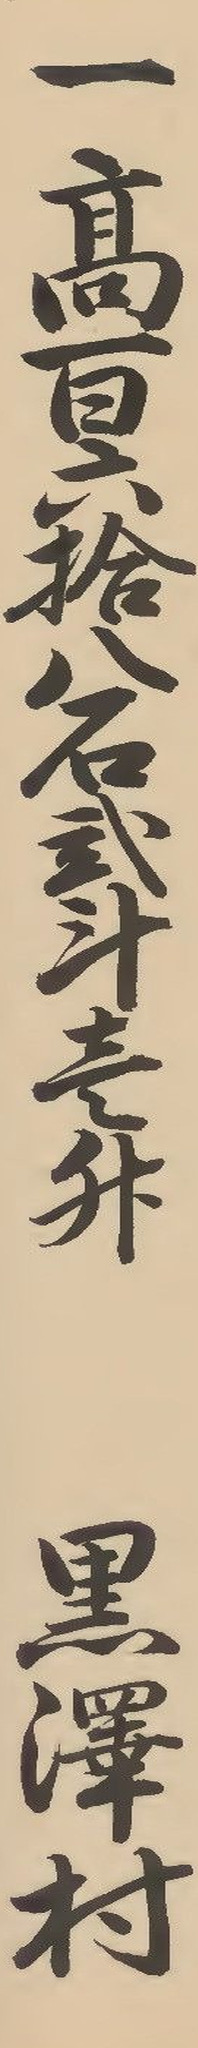一高百六拾八石弐斗壱升黒沢村
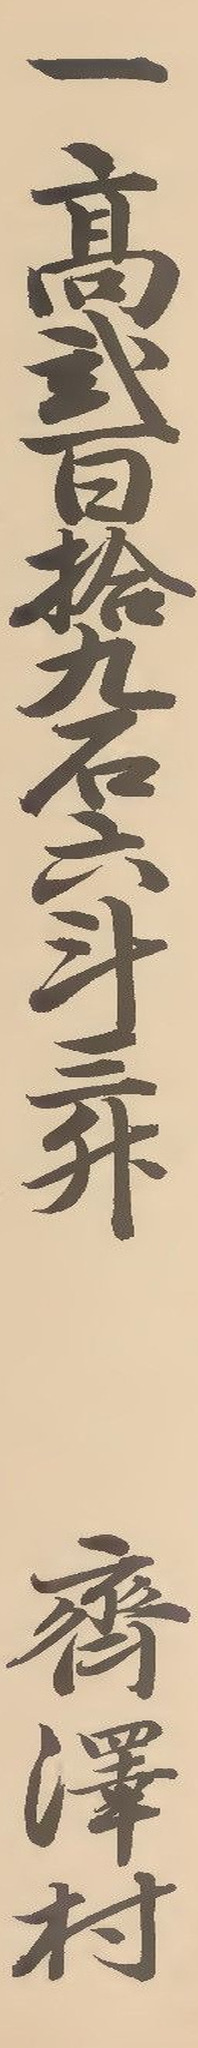一高弐百拾九石六斗三升斉沢村
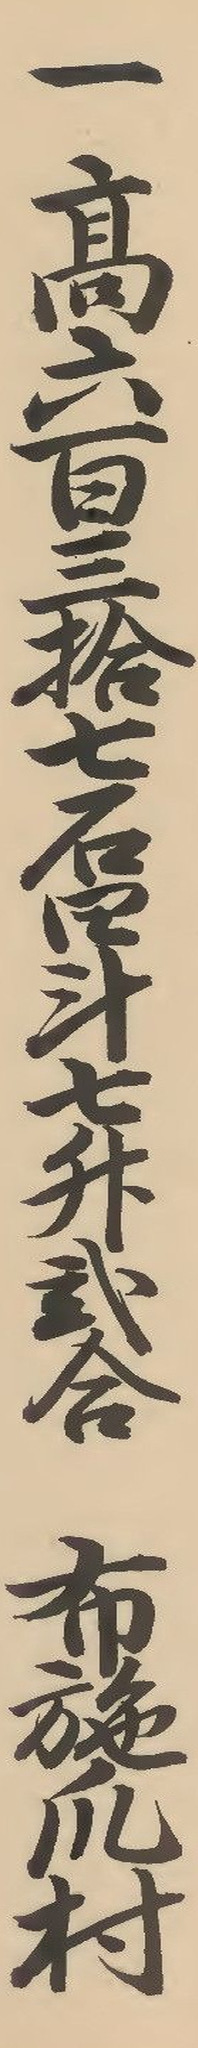一高六百三拾七石四斗七升弐合布施瓜村
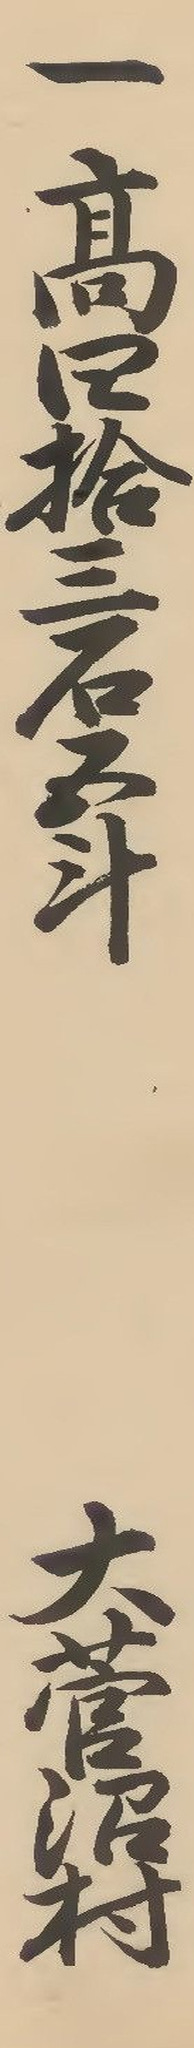一高四拾三石五斗大菅沼村

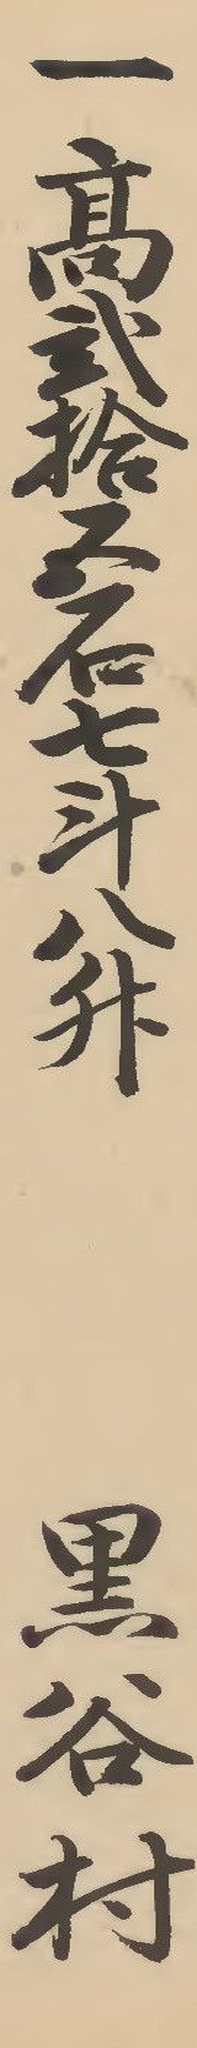一高弐拾五石七斗八升黒谷村
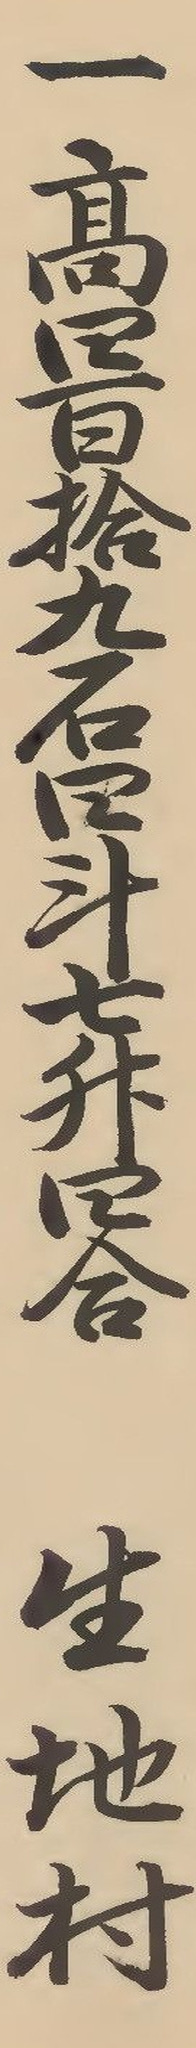一高四百拾九石四斗七升四合生地村
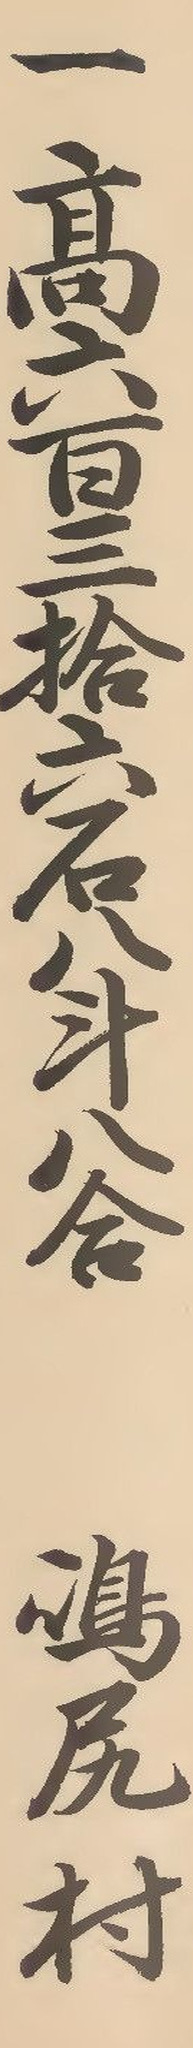一高六百三拾六石八斗八合島尻村
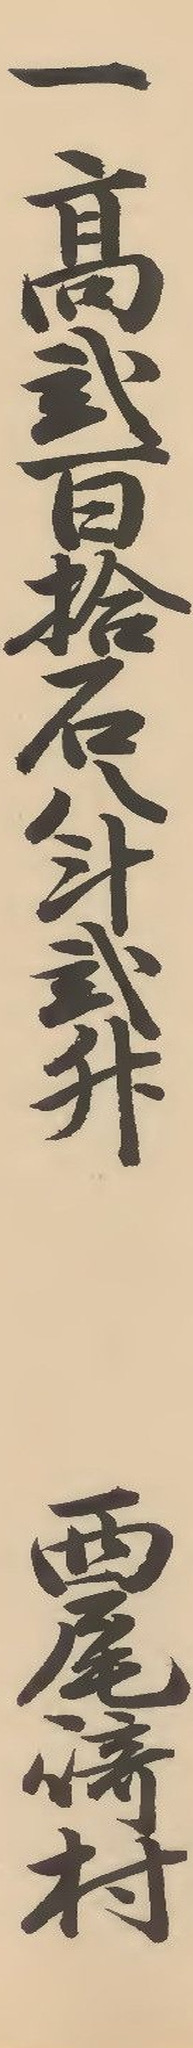一高弐百拾石八斗弐升西尾崎村

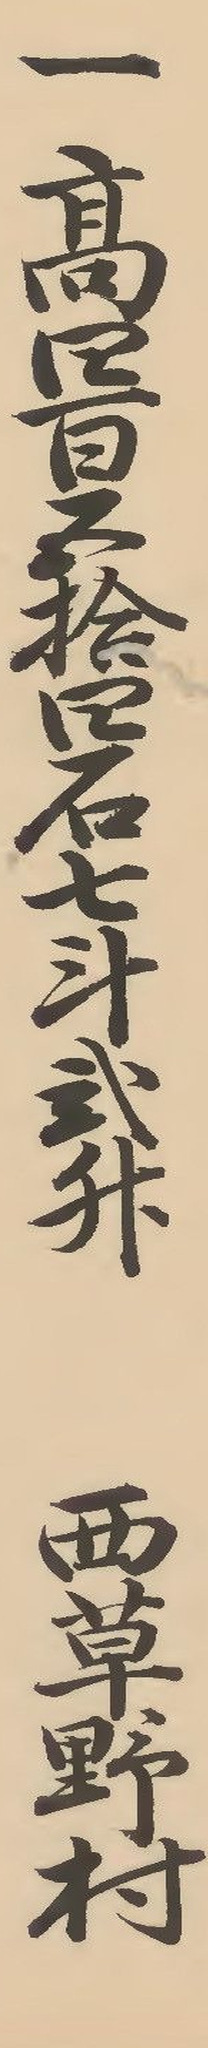一高四百五拾四石七斗弐升西草野村
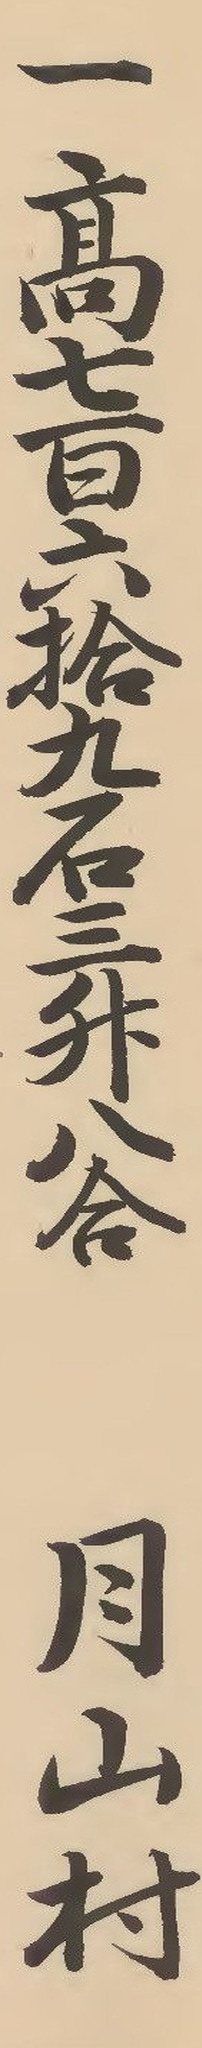一高七百六拾九石三升八合月山村
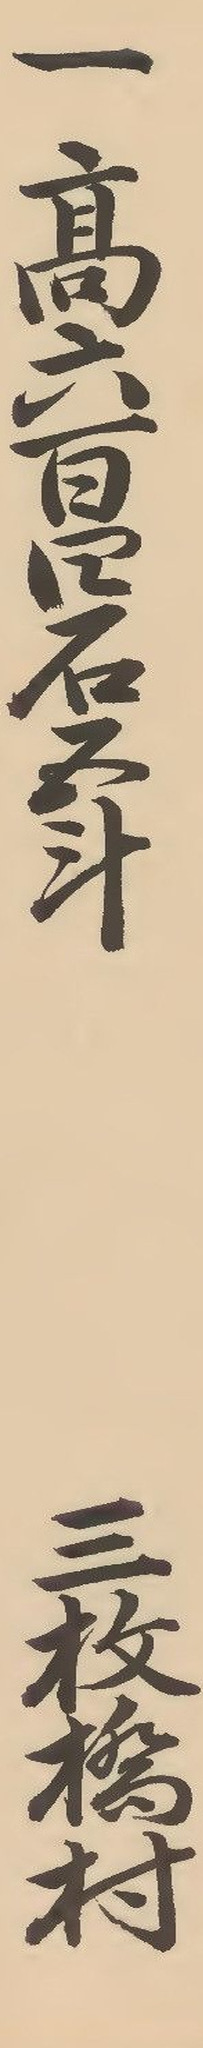一高六百四石五斗三枚橋村
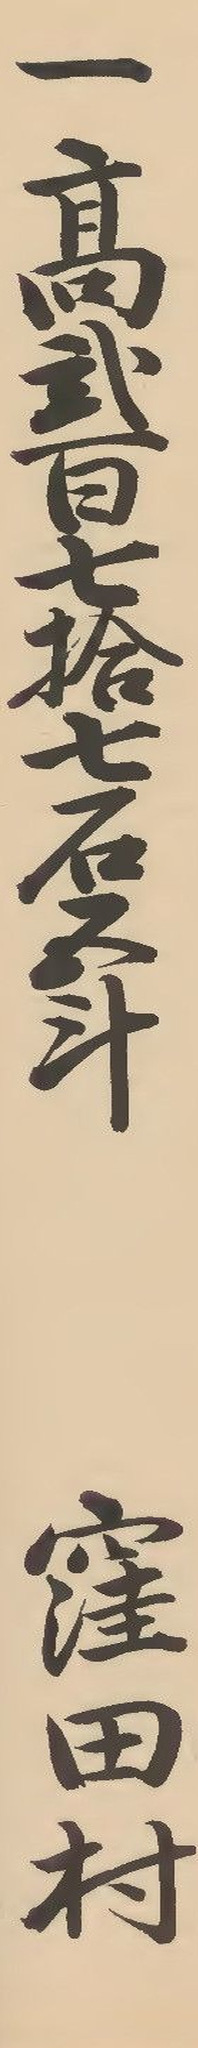一高弐百七拾七石五斗窪田村
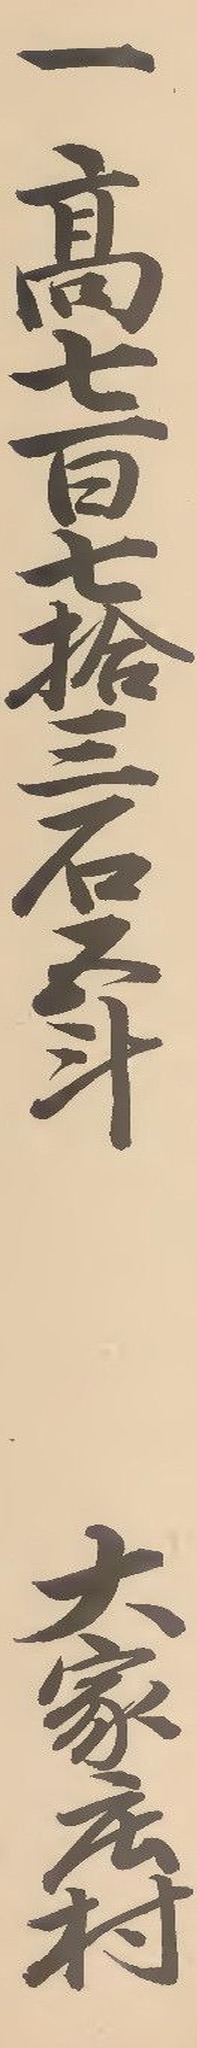一高七百七拾三石五斗大家庄村

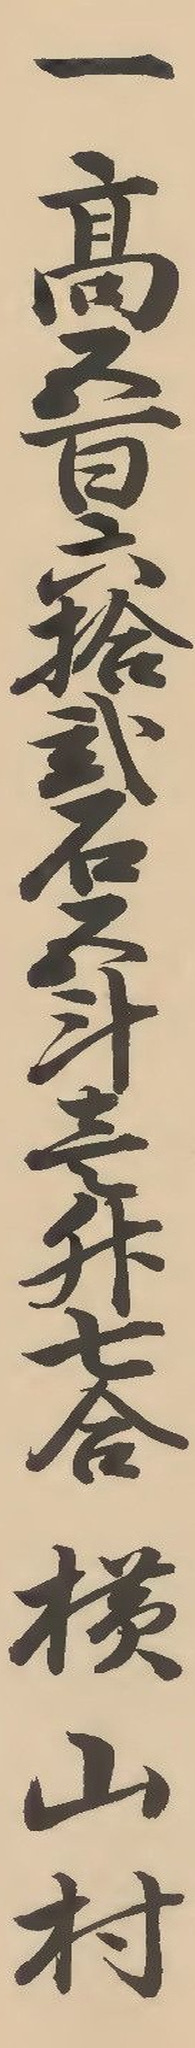一高五百六拾弐石五斗壱升七合横山村
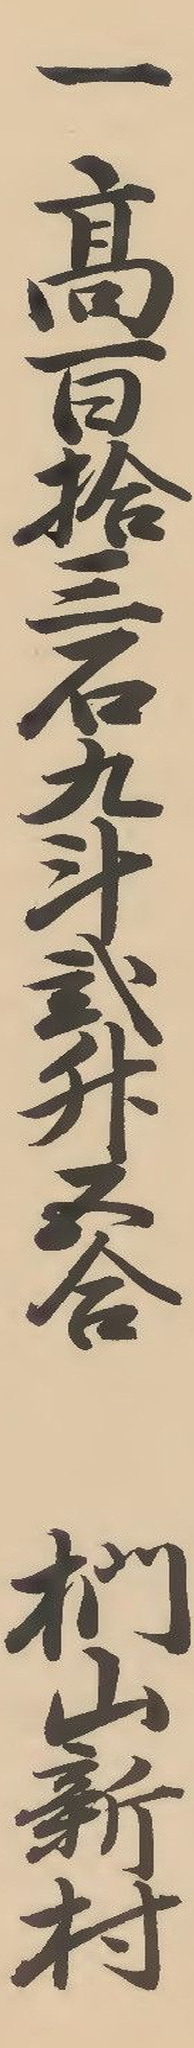一高百拾三石九斗弐升五合椚山新村
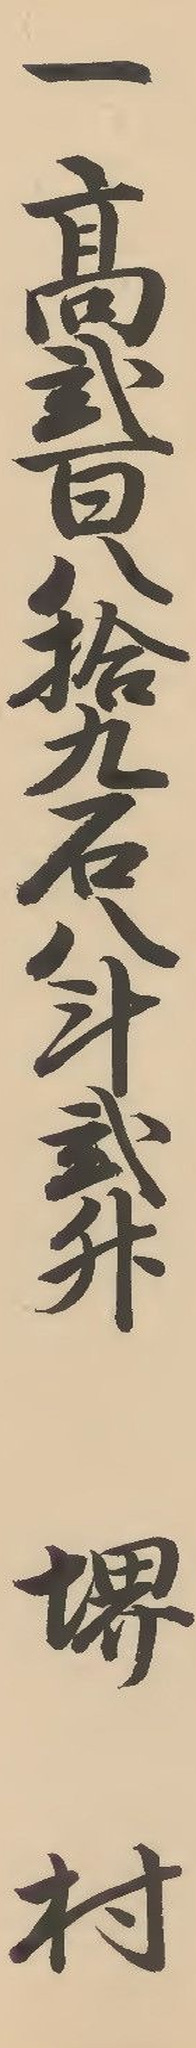一高弐百八拾九石八斗弐升堺村
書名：越中国郷帳
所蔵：国立公文書館 National Archives of Japan
